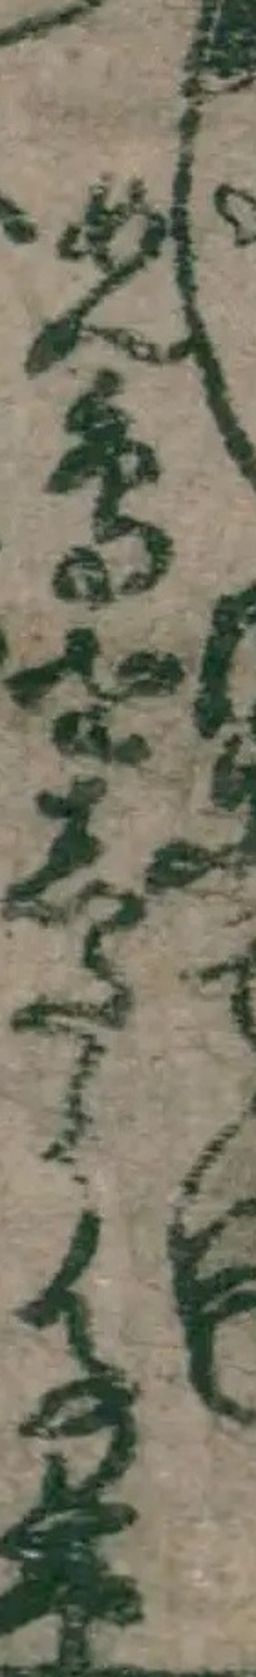めん鳥をしたう事年
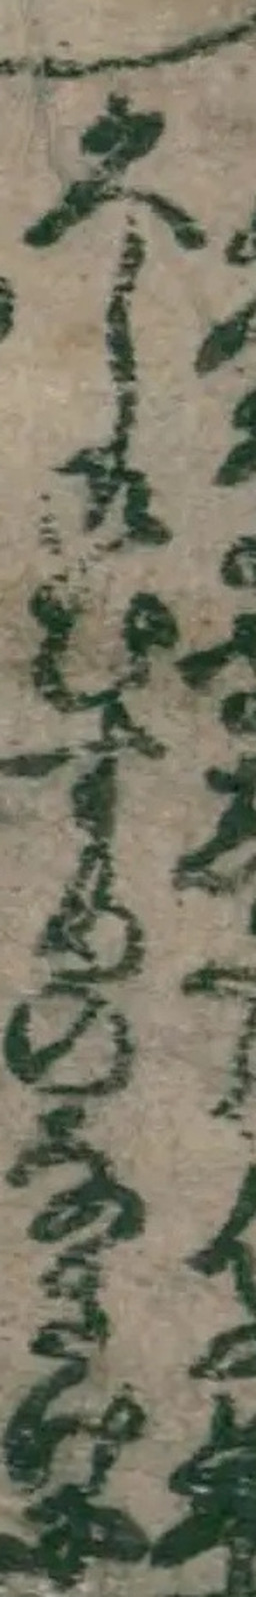久く候むすめのなさけに
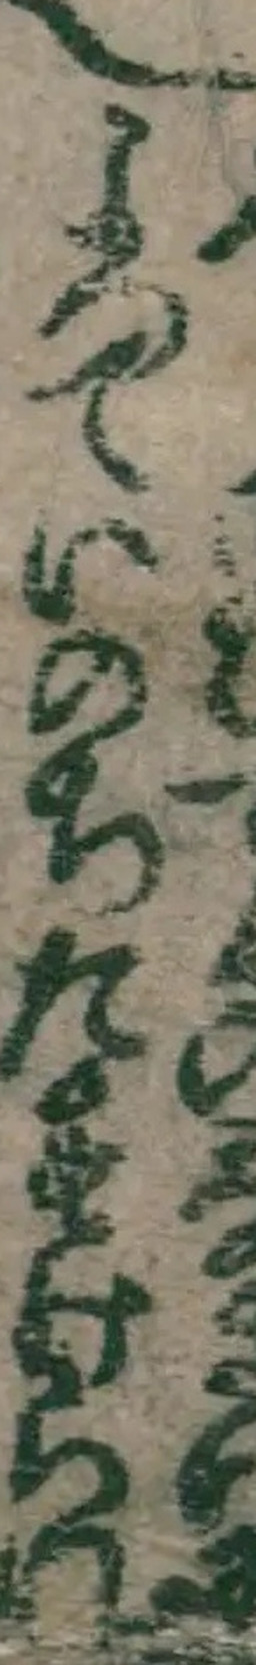よつていのちたすけられ
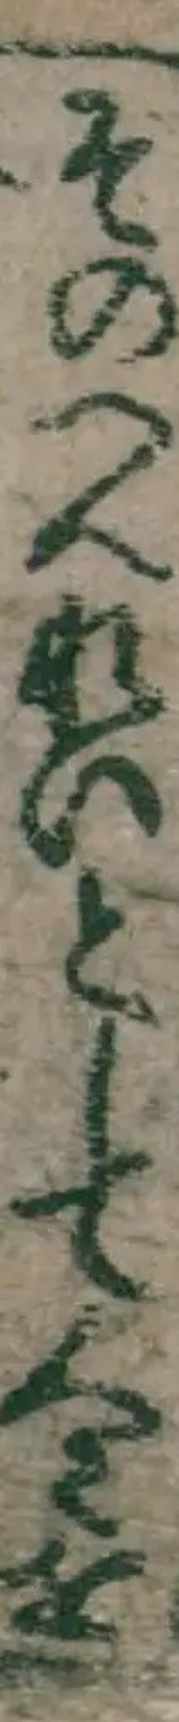そのへんれいとして人々を
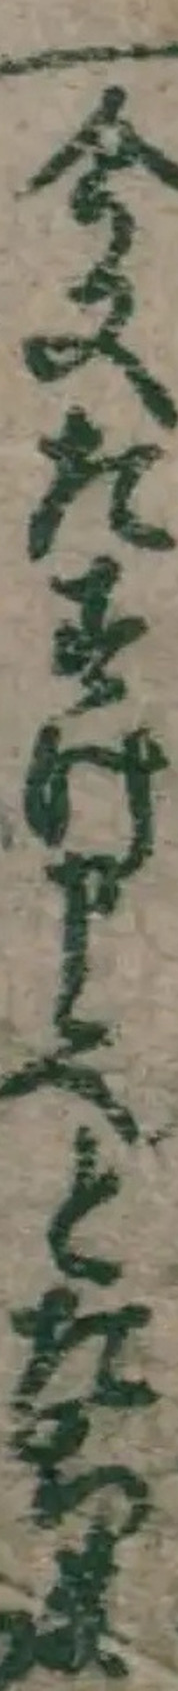今又たすけ申也とたちまち
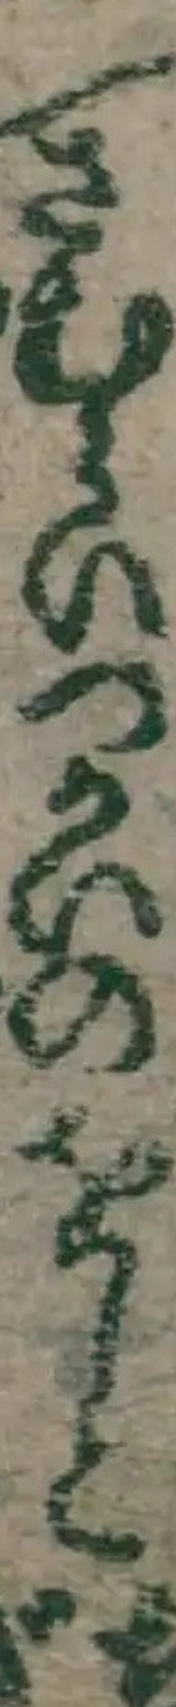さむらいつかいのをしと
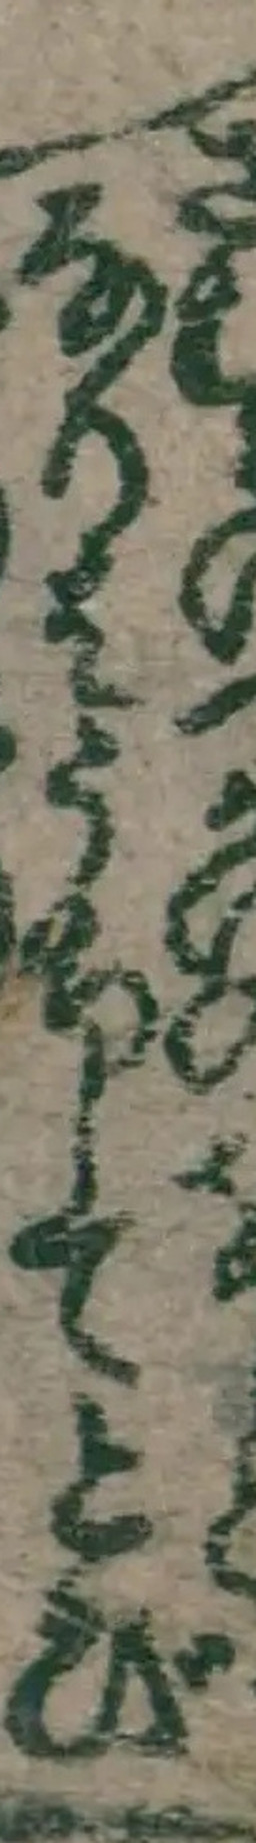なりはうちしてとび
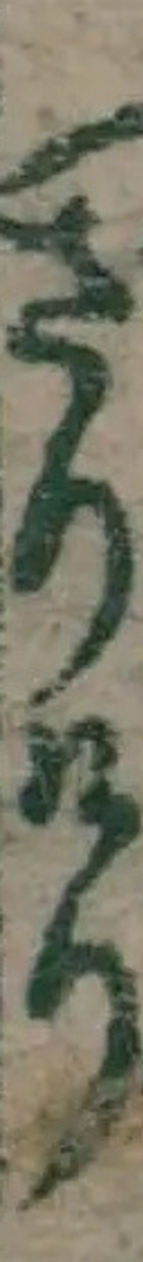さりけり

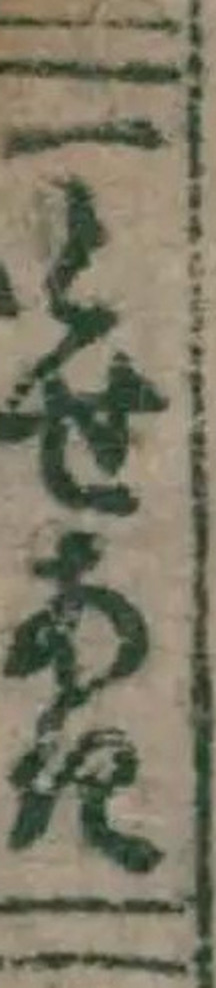一とせあき
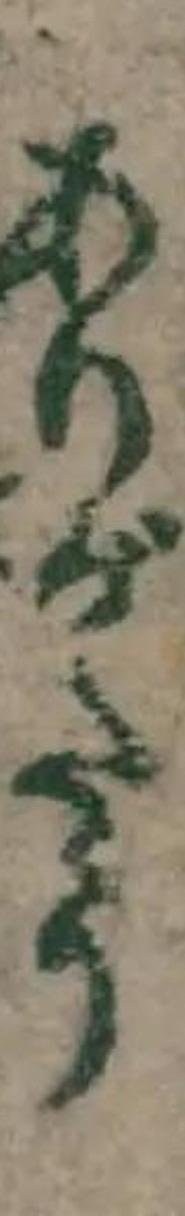ありがたう
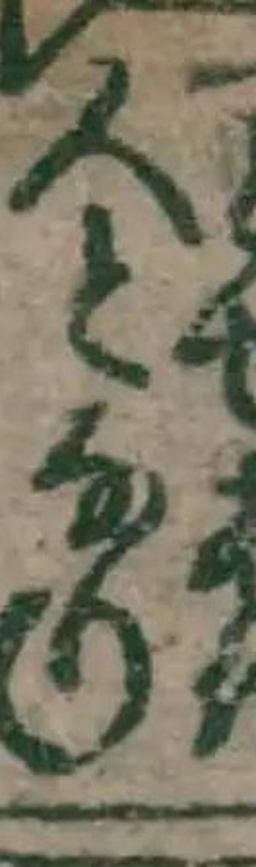人となり
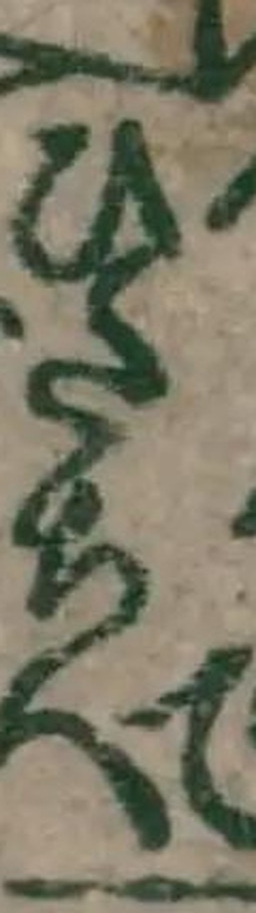ひたちへ
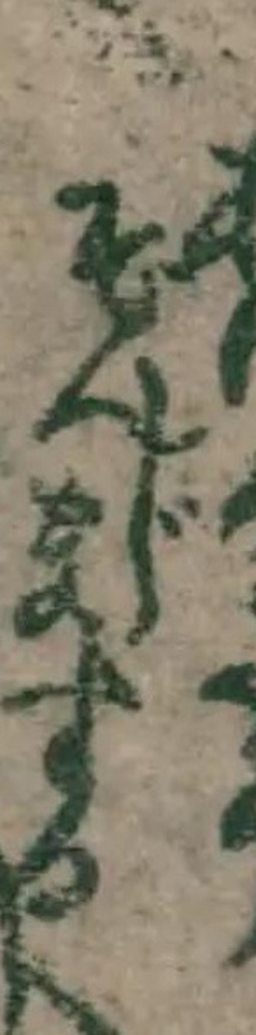ぞんじまする
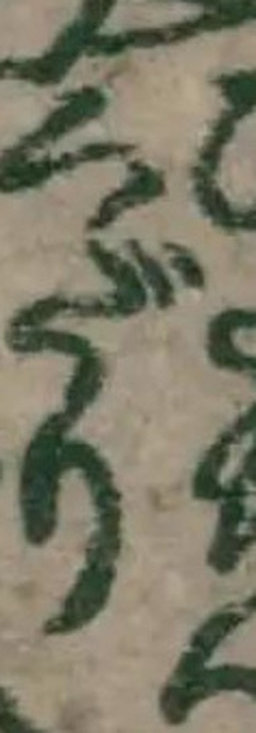くだり
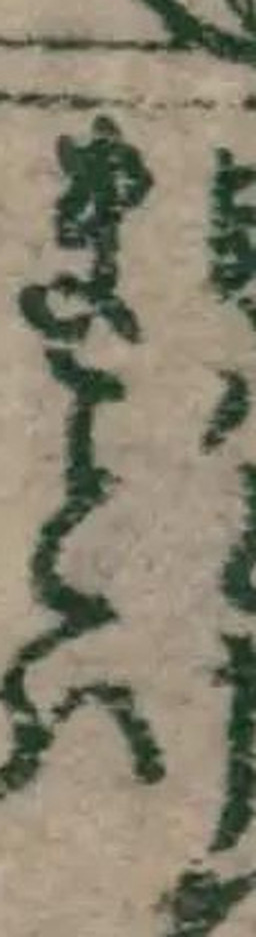まことは
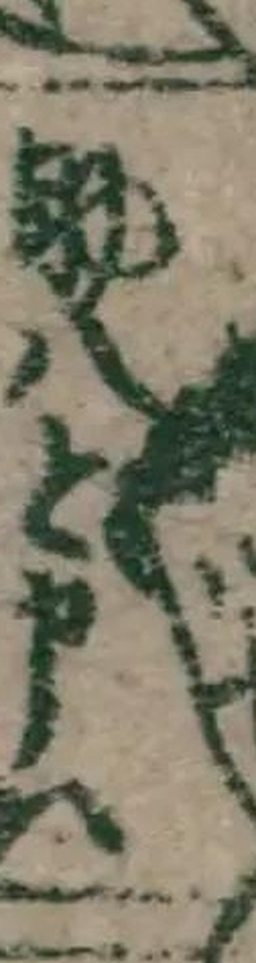助八と申は
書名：塩売文太物語 2巻
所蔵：国立国会図書館 National Diet Library, JAPAN
